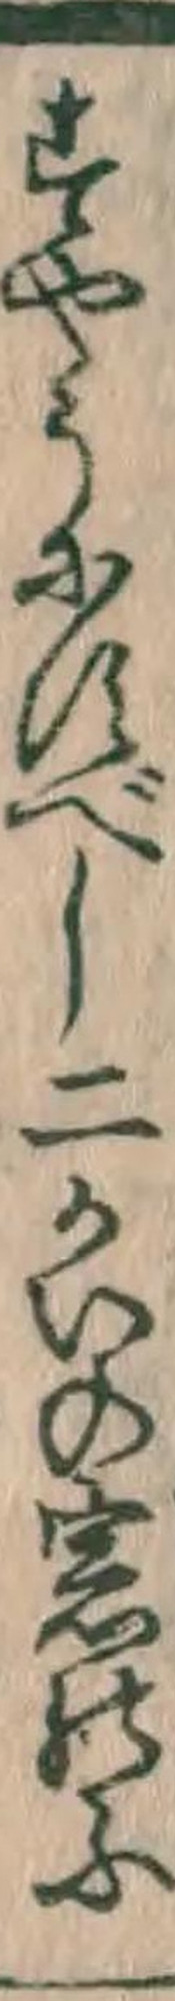すやうにすべし二かいの窓のふ
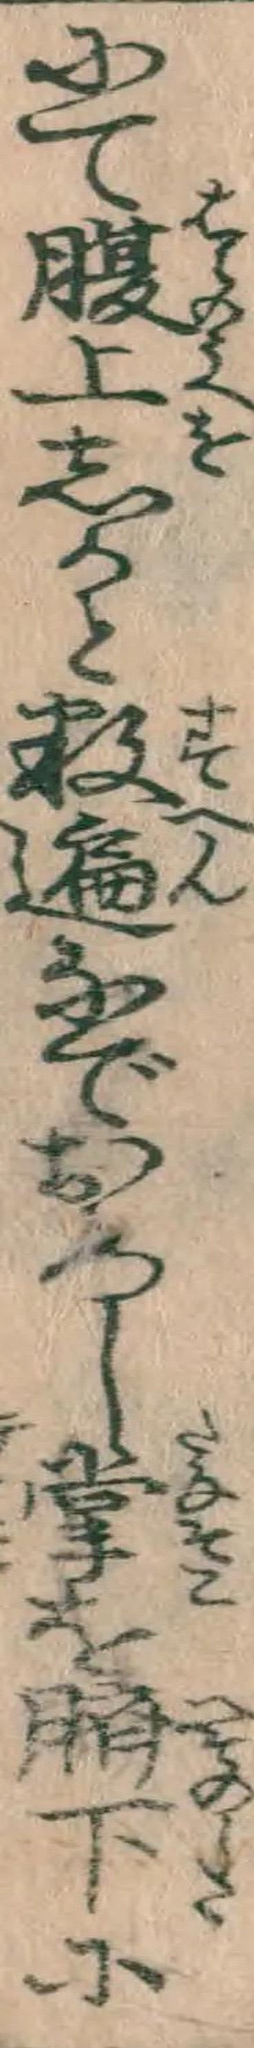にて腹上しかと数遍なでおろし掌を臍下に
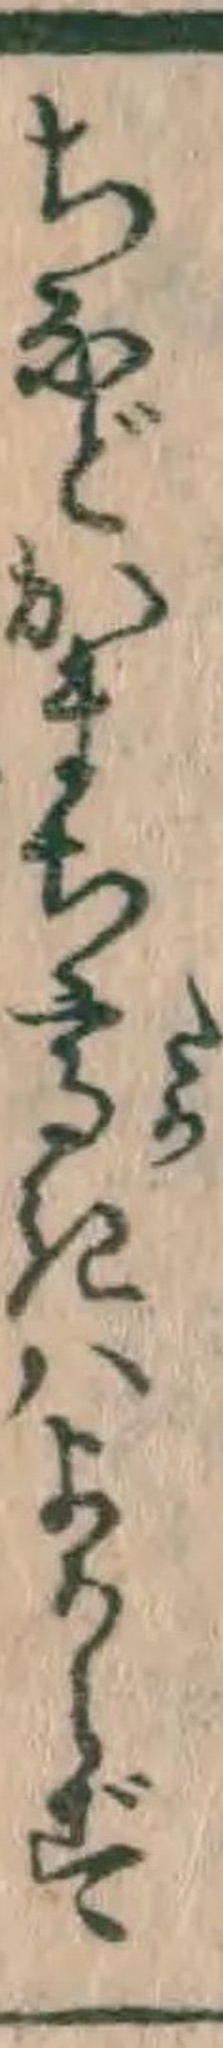ちなどかまち高きはよからず
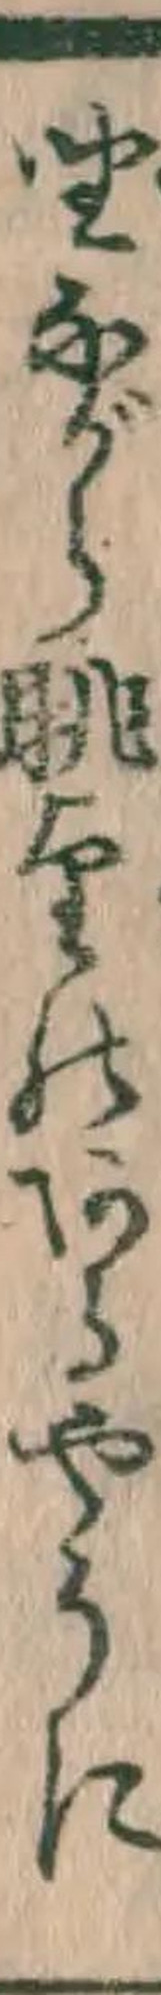坐ながら眺望のあるやうに
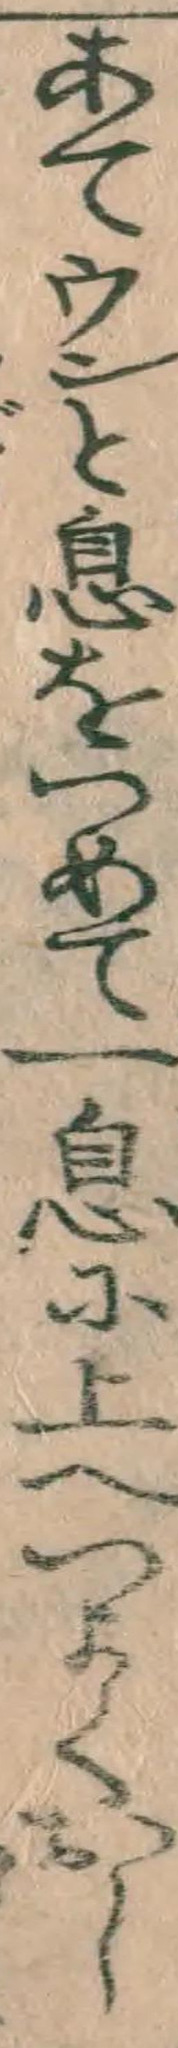あてウンと息をつめて一息に上へつよくおし
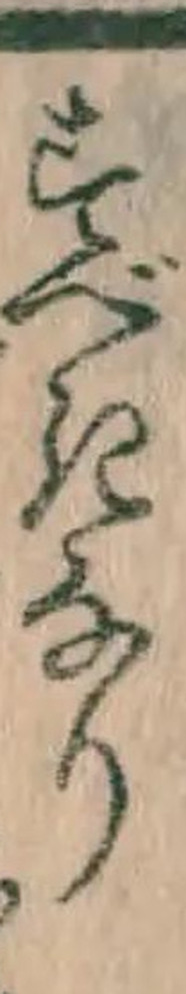すべきなり
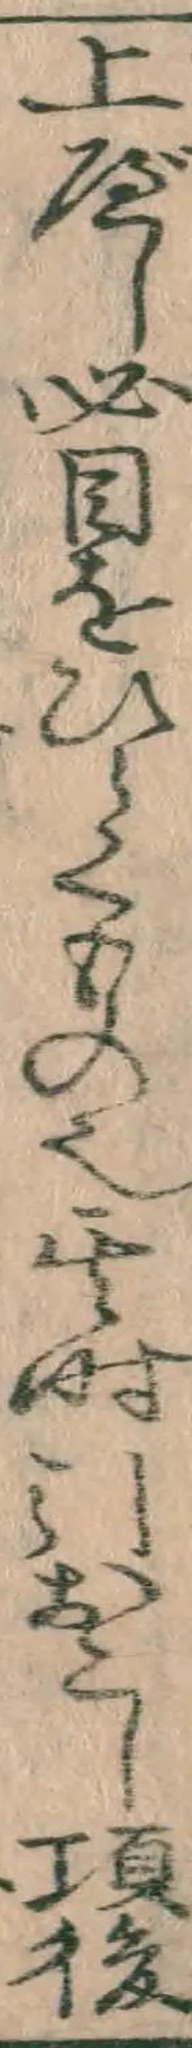上べし必目をひらくもの也其時引おこし項後
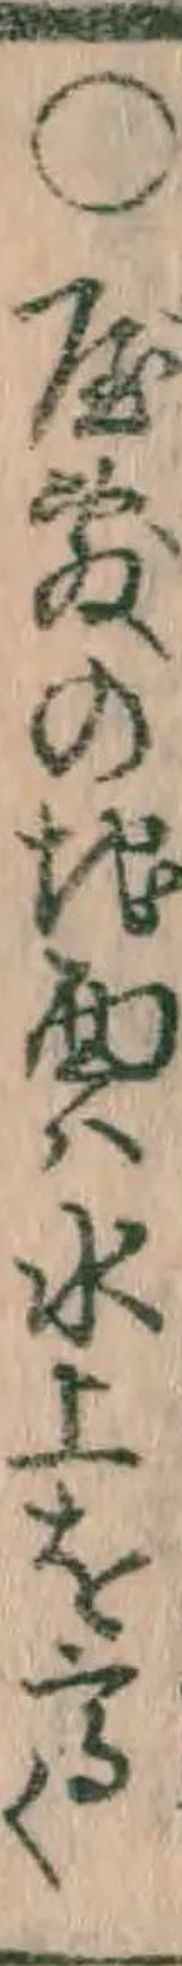○屋敷の地面は水上を高く
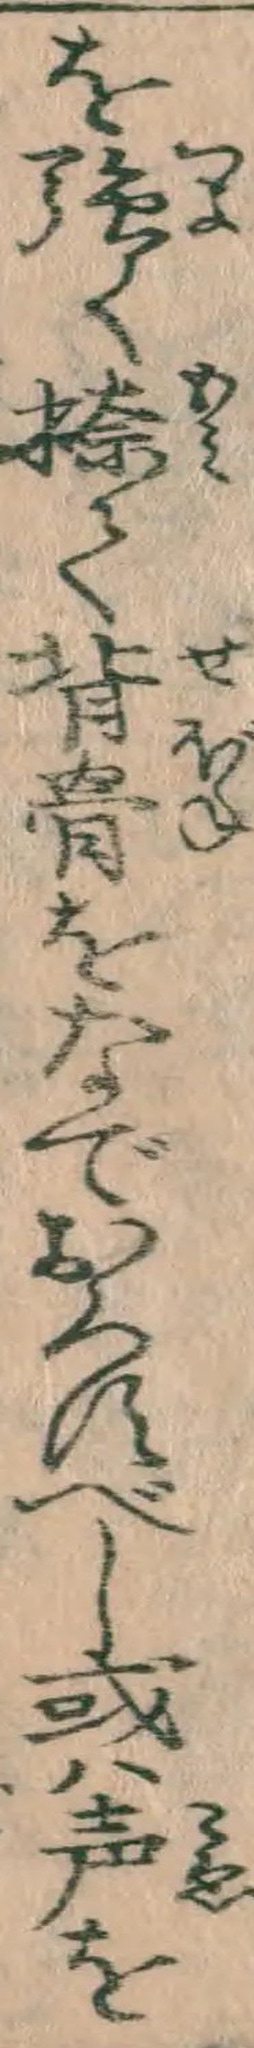を強く捺て背骨をなでおろすべし或は声を
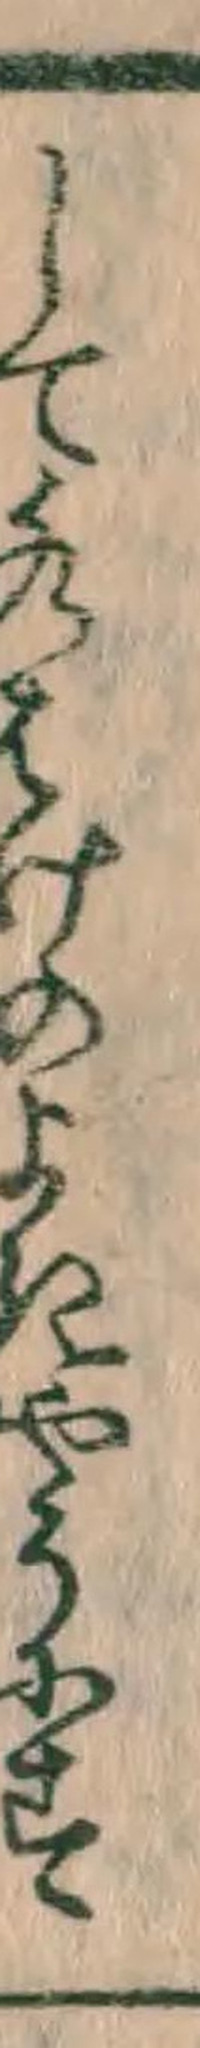して水はけのよきやうにす
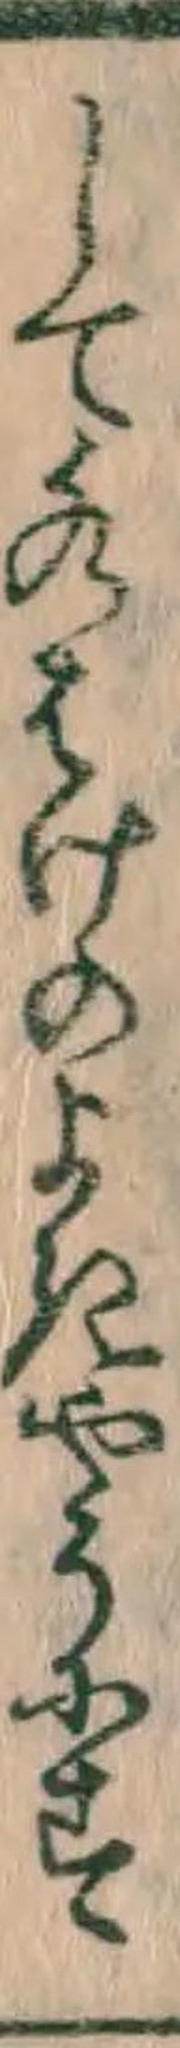して水はけのよきやうにす
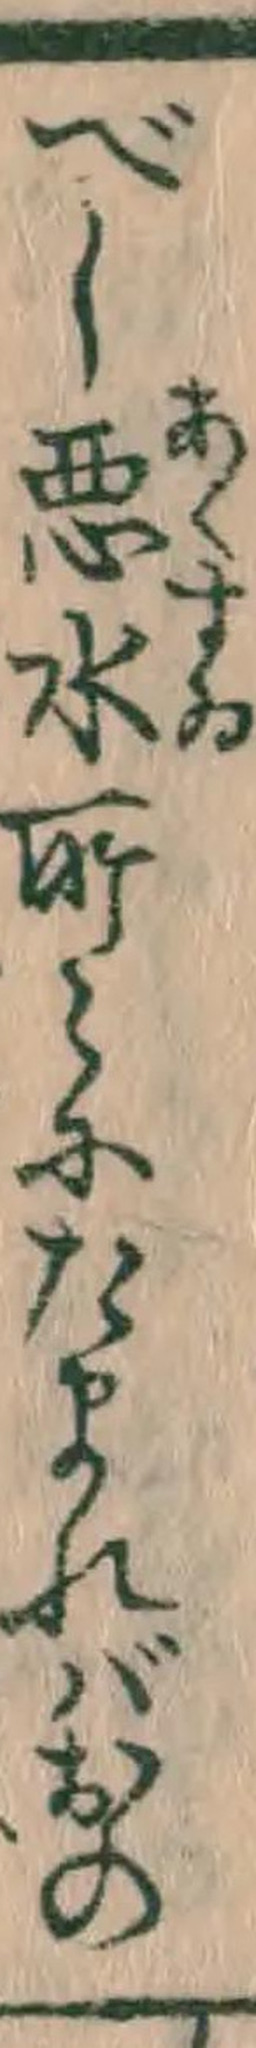べし悪水所々にたまればおの
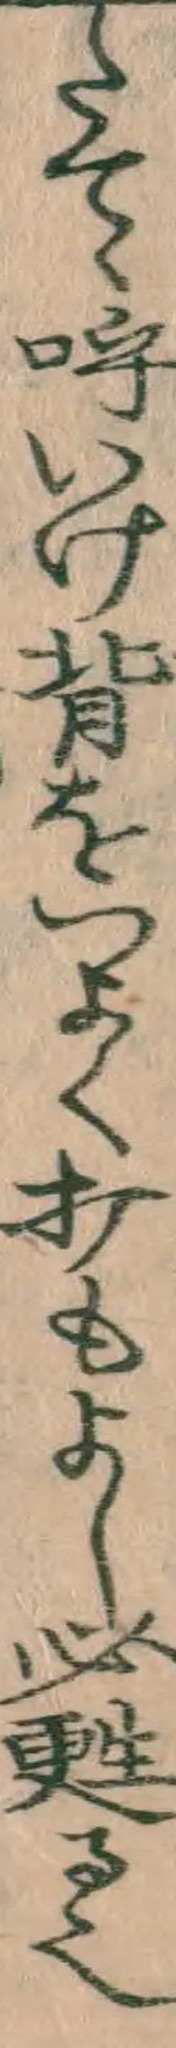たてて呼いけ背をつよく打もよし必甦る也
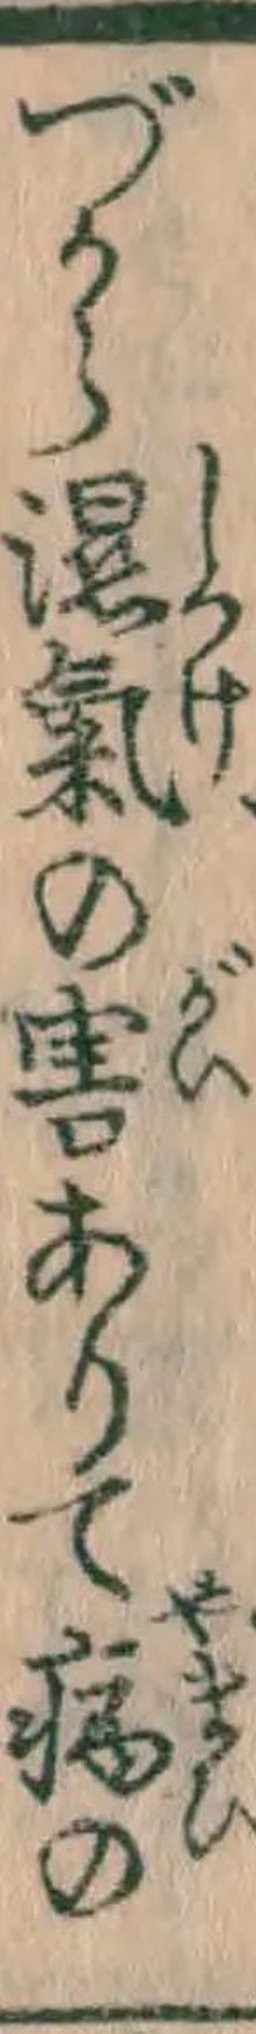づから湿気の害ありて病の
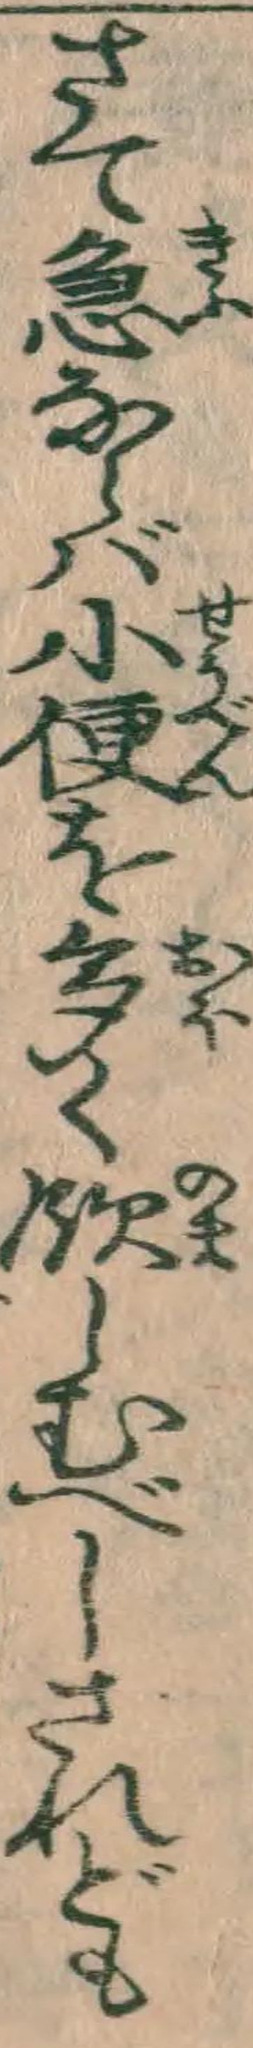さて急ならば小便を多く飲しむべしされども
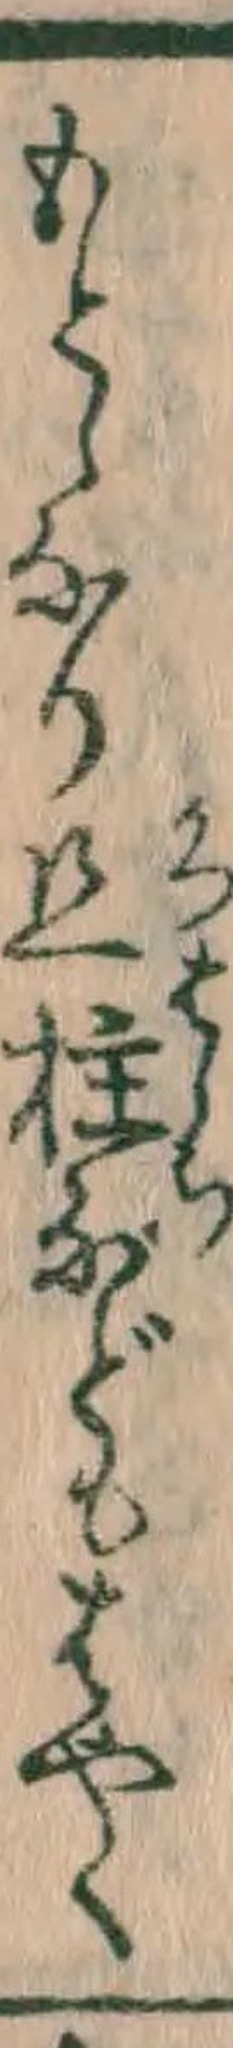もとゝなり且柱などもはやく
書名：広益秘事大全 3巻. [3]
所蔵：国立国会図書館 National Diet Library, JAPAN
